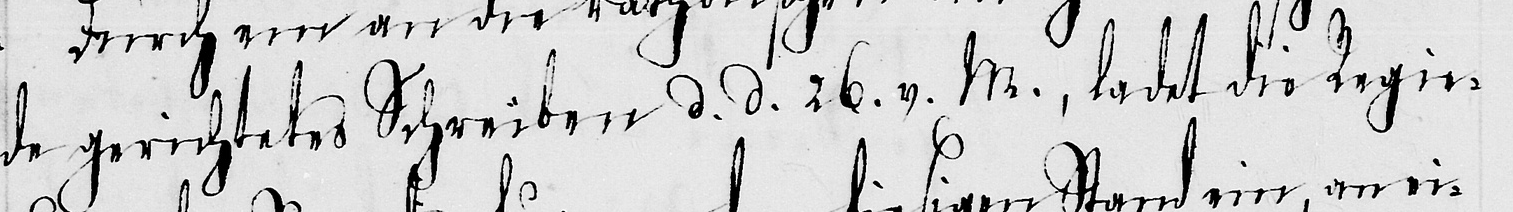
de gerichtetes Schreiben d. d. 26. v. M., ladet die Regie¬
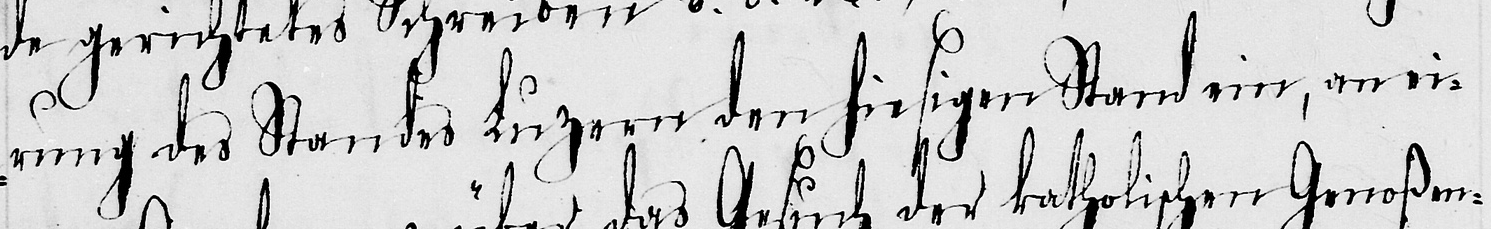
rung des Standes Luzern den hiesigen Stand ein, an ei¬
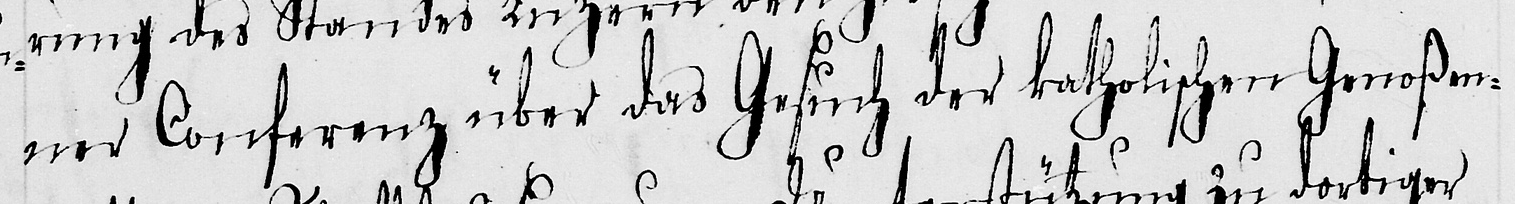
ner Conferenz über das Gesuch der katholischen Genoßen¬
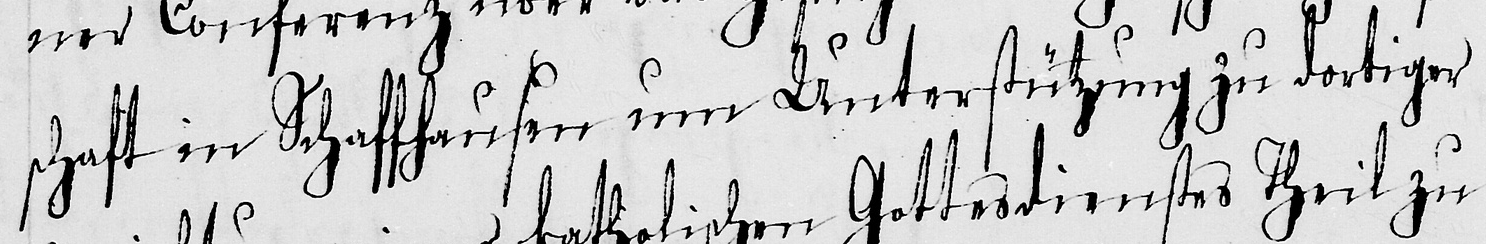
schaft in Schaffhausen um Unterstützung zu dortiger
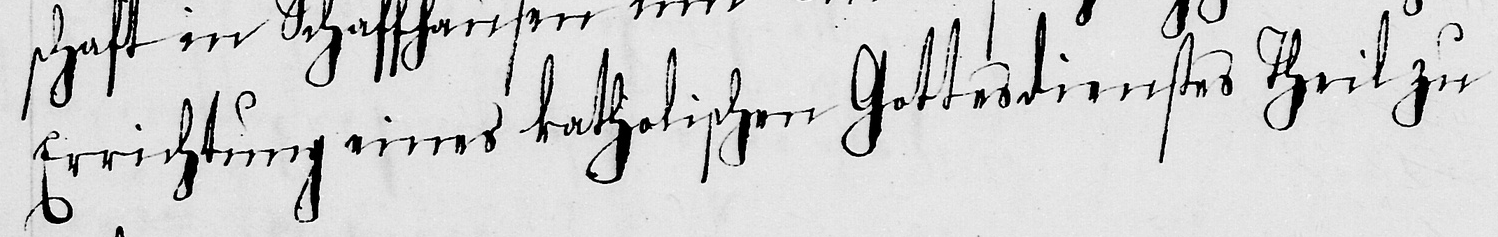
Errichtung eines katholischen Gottesdienstes Theil zu
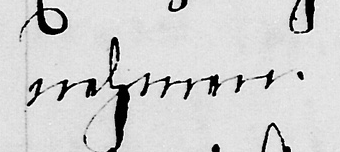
nehmen.
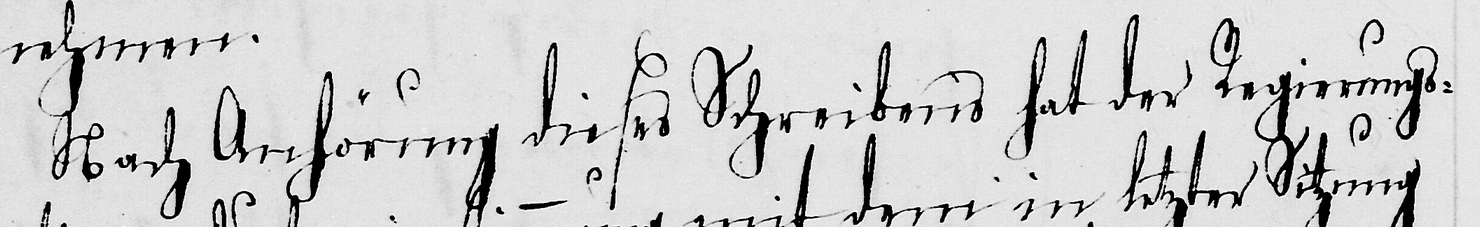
Nach Anhörung dieses Schreibens hat der Regierungs¬
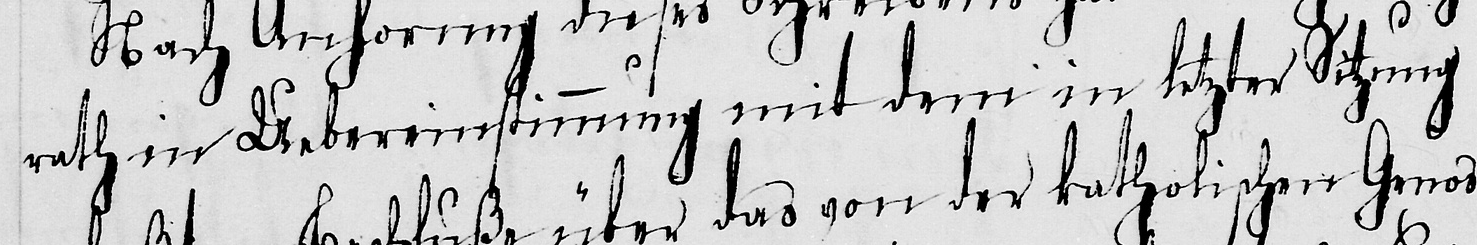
rath in Uebereinstimmung mit dem in letzter Sitzung
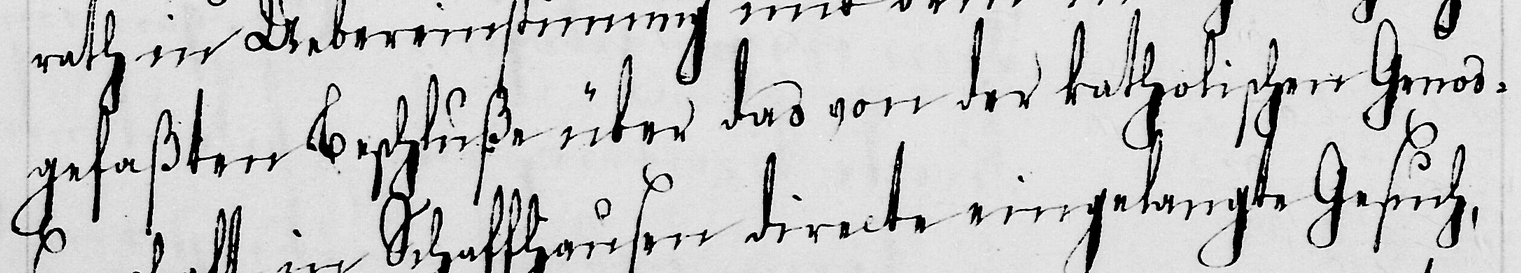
gefaßten Beschluße über das von der katholischen Genoß¬
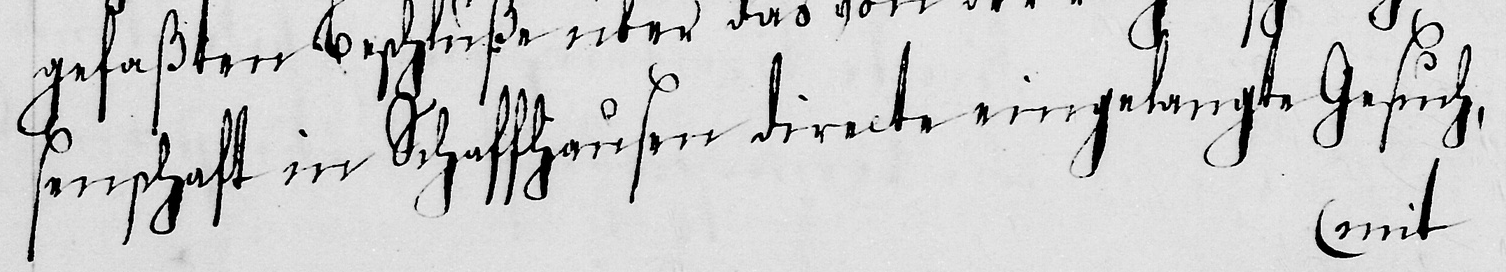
enschaft in Schaffhausen directe eingelangte Gesuch,
